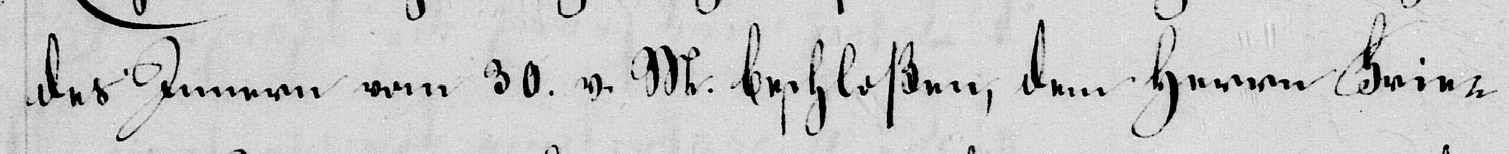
des Innern vom 30. v. M. beschloßen, dem Herrn Hein¬
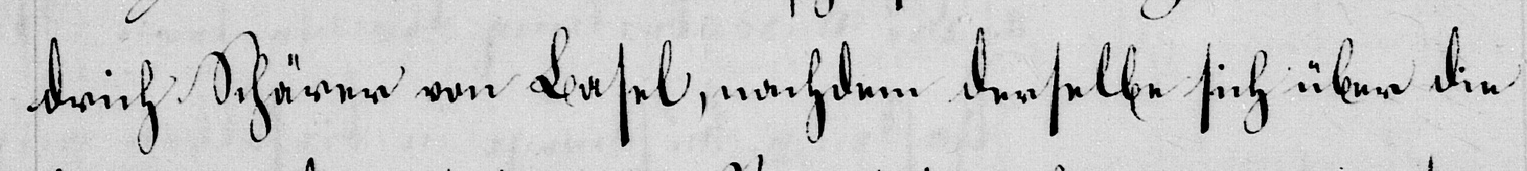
rich Schärer von Basel, nachdem derselbe sich über die
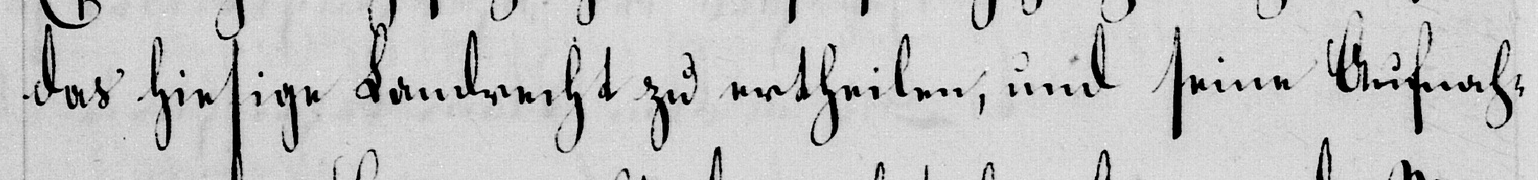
das hiesige Landrecht zu ertheilen, und seine Aufnah¬
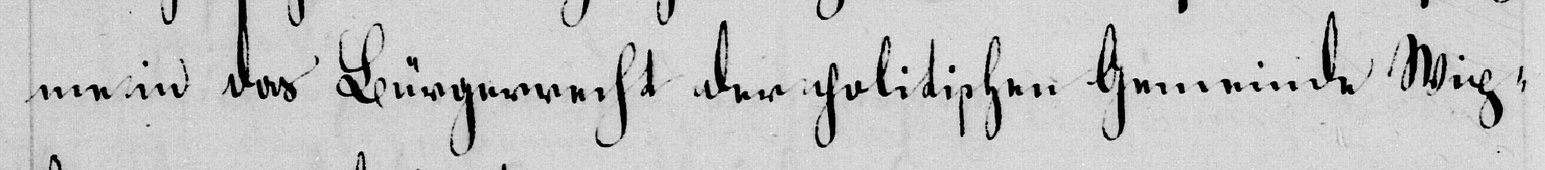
me in das Bürgerrecht der politischen Gemeinde Wip¬
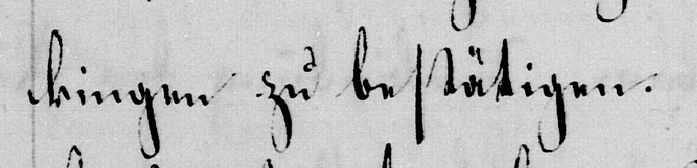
kingen zu bestätigen.
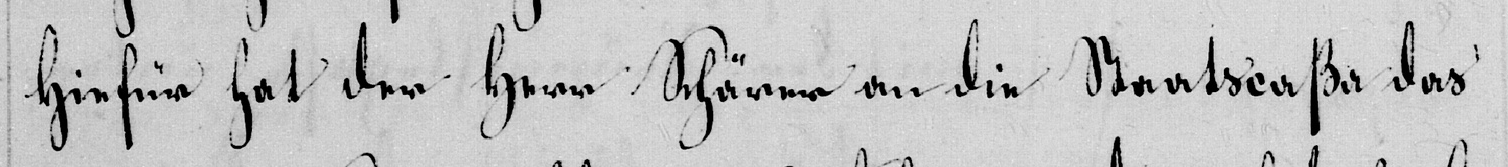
Hiefür hat der Herr Schärer an die Staatscaßa das
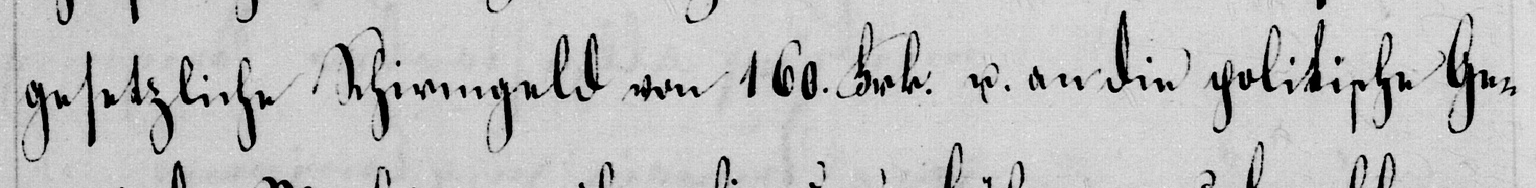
gesetzliche Schirmgeld von 160. Frk. u. an die politische Ge¬
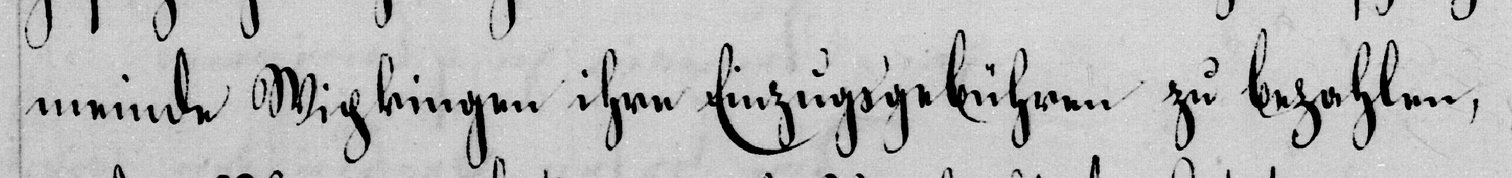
meinde Wipkingen ihre Einzugsgebühren zu bezahlen,
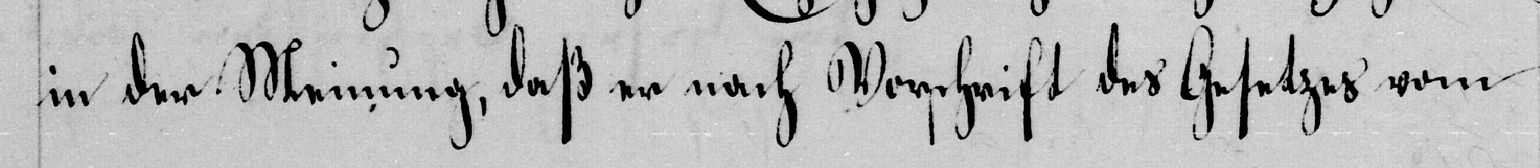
in der Meinung, daß er nach Vorschrift des Gesetzes vom
